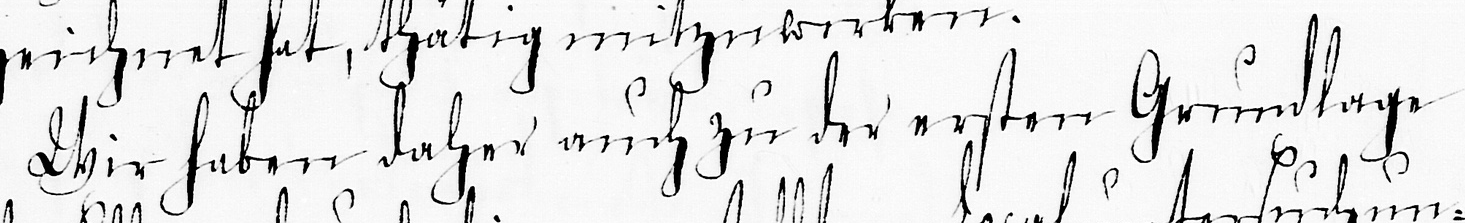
Wir haben daher auch zu der ersten Grundlage
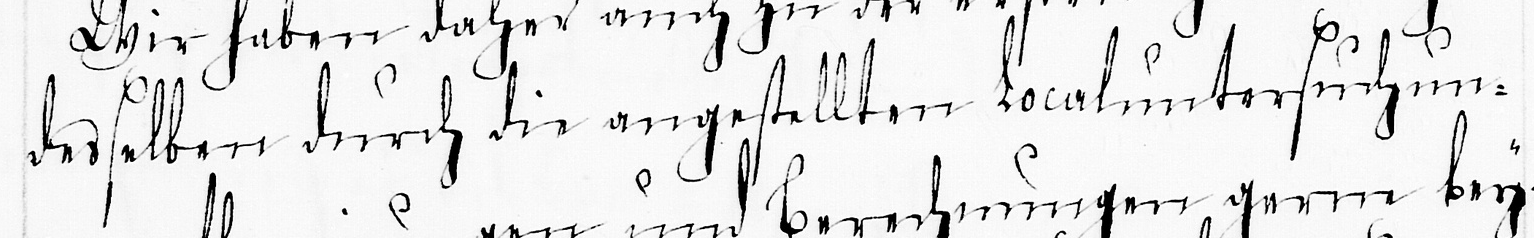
desselben durch die angestellten Localuntersuchun¬
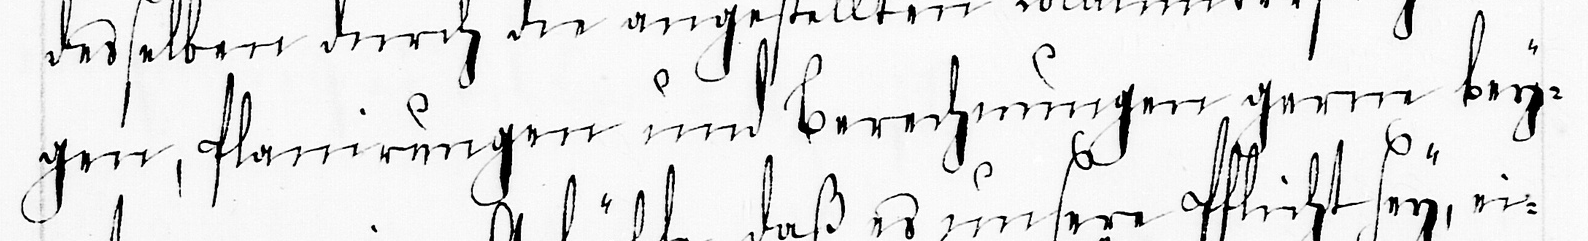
gen, Planirungen und Berechnungen gerne bey¬
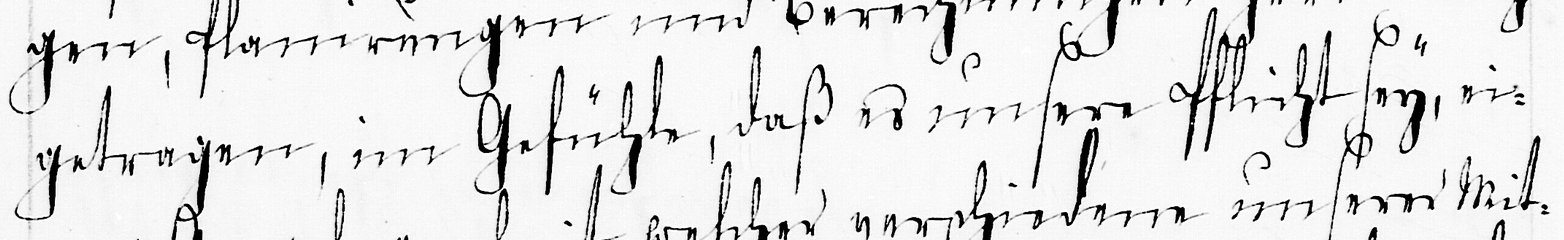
getragen, im Gefühle, daß es unsere Pflicht sey, ei¬
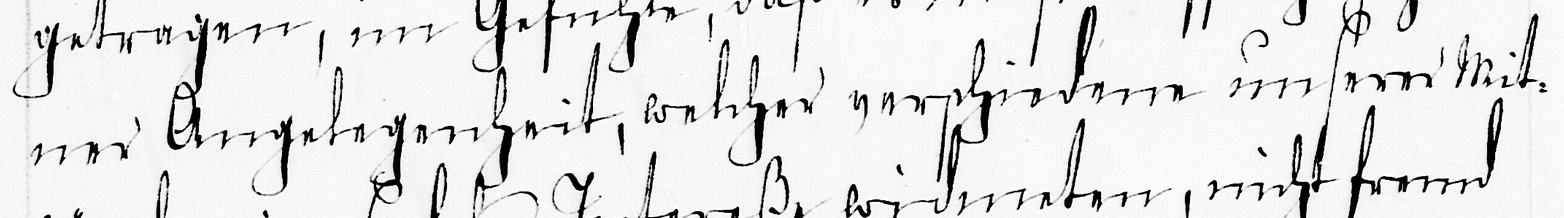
ner Angelegenheit, welcher verschiedene unserer Mit¬
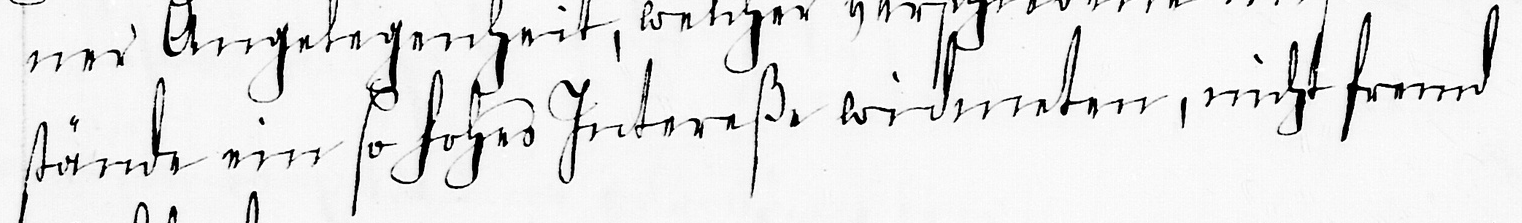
stände ein so hohes Intereße widmeten, nicht fremd
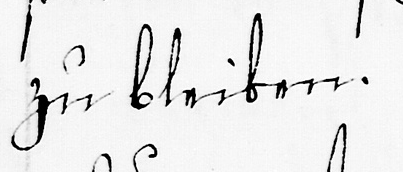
zu bleiben.
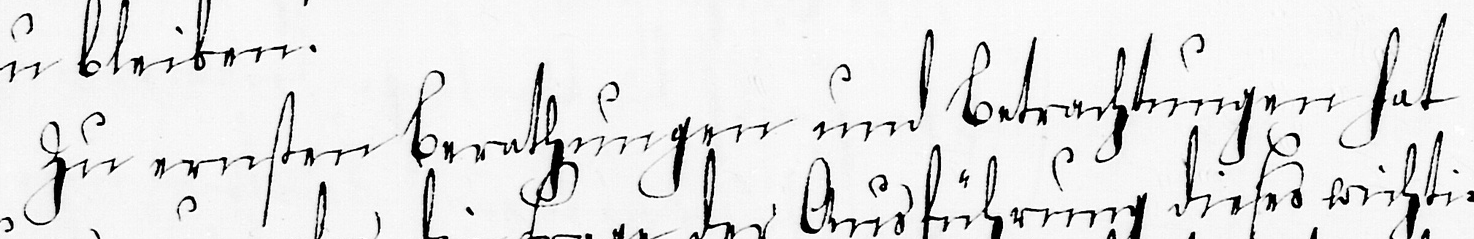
Zu ernsten Berathungen und Betrachtungen hat
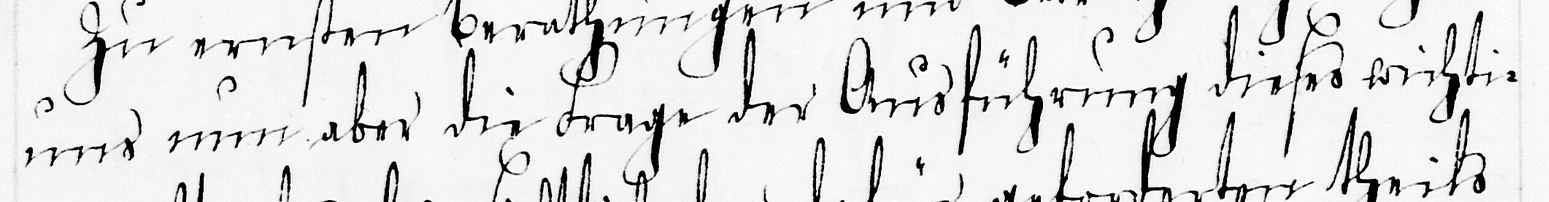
uns nun aber die Frage der Ausführung dieses wichti¬
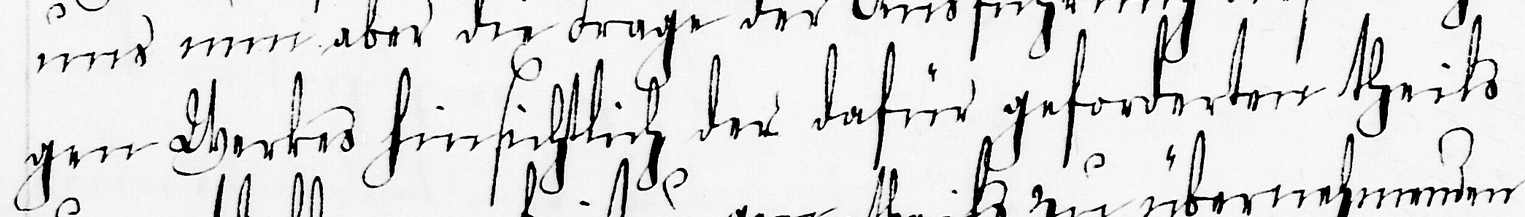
gen Werkes hinsichtlich der dafür geforderten theils
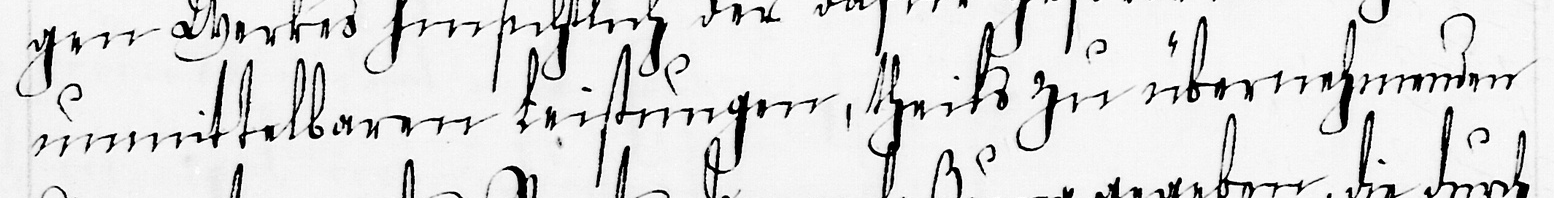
unmittelbaren Leistungen, theils zu übernehmenden
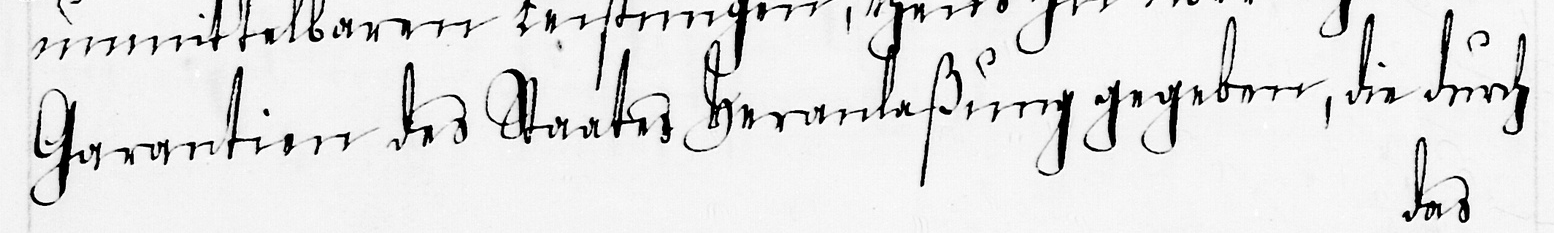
Garantien des Staates Veranlaßung gegeben, die durch
